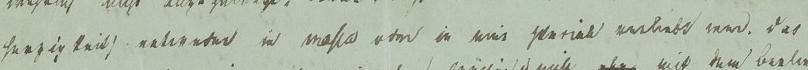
herzigkeit) entweder in massa oder in eine speciel verliebt war. Das
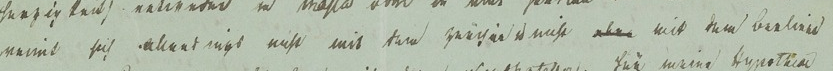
reimt sich allerdings nicht mit dem Zürcher & nicht eben mit dem Berliner
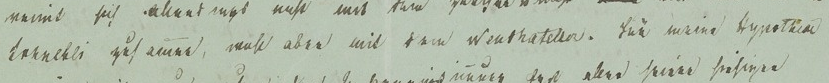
Schnebli zusammen, wohl aber mit dem Neuchateller. Für meine Hypothese
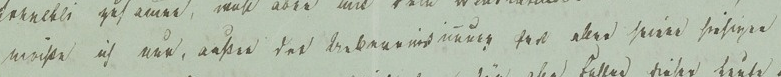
möchte ich nur, außer der Uebereinstimmung fast aller seiner hiesigen
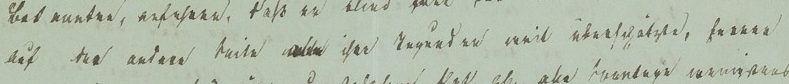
auf der andern Seite alle ihre Tugenden weit überschätzte, ferner
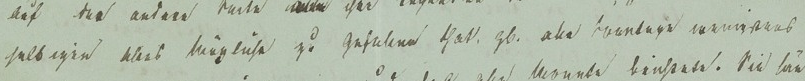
selbigen Alles Mögliche zu Gefallen that. zB. alle Sonntage wenigstens
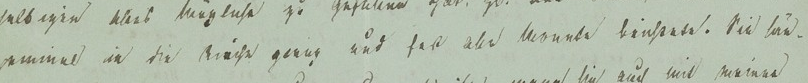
einmal in die Kirche gieng und fast alle Monate beichtete. Sie hän-
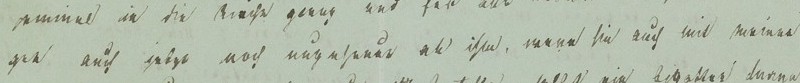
gen auch jetzt noch ungeheuer an ihm, wenn sie auch mit meiner
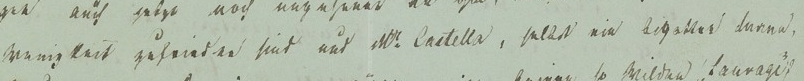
Wenigkeit zufrieden sind und MrCastella, selbst ein bigotter Mann,
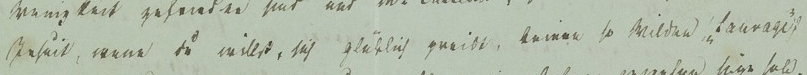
Jesuit, wenn du willst, sich glüklich preist, keinen so Wilden («Sauvage»)
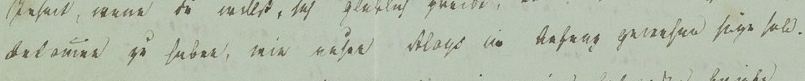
bekommen zu haben, wie unser Aloys am Anfang gewesen seyn soll.
